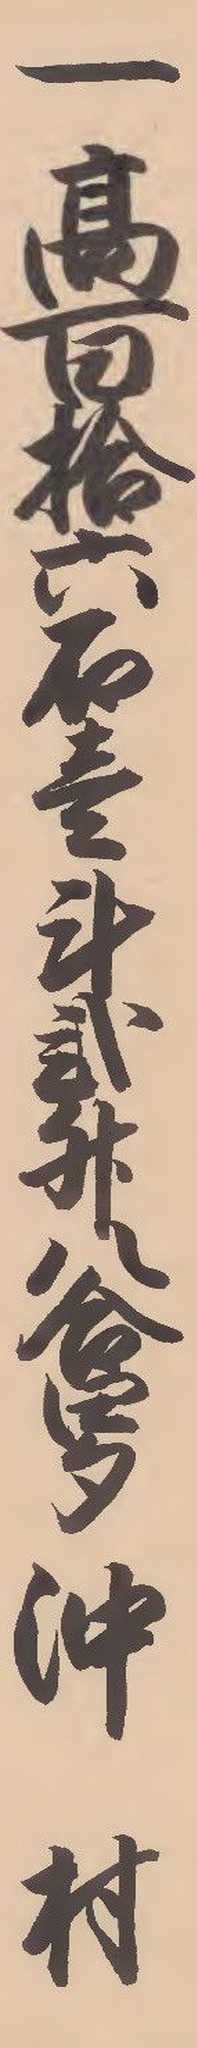一髙百拾六石壱斗弐升八合四夕沖村
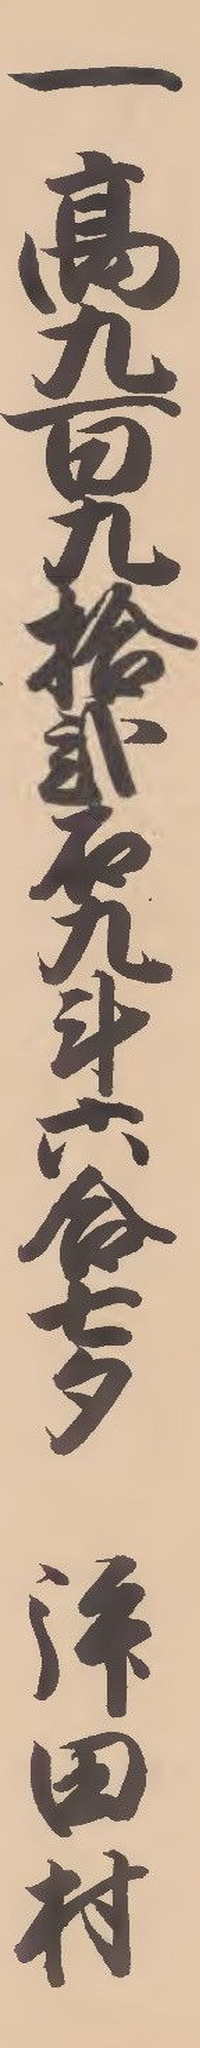一髙九百九拾弐石九斗六合七夕拝田村
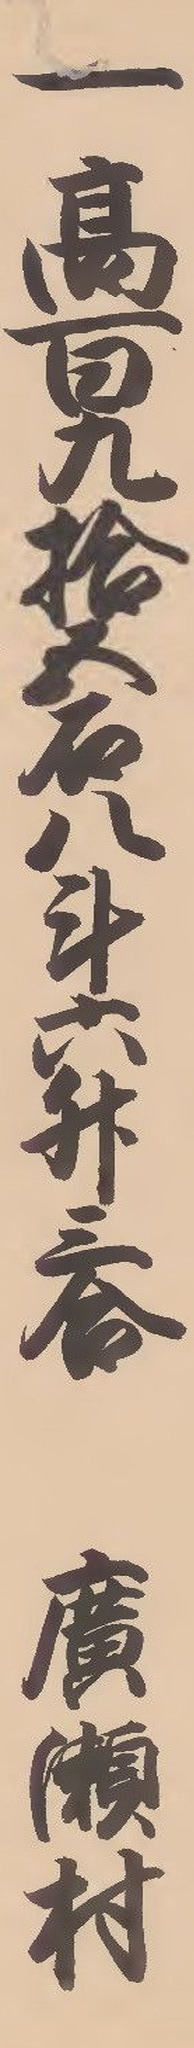一髙百九拾五石八斗六升三合廣瀬村
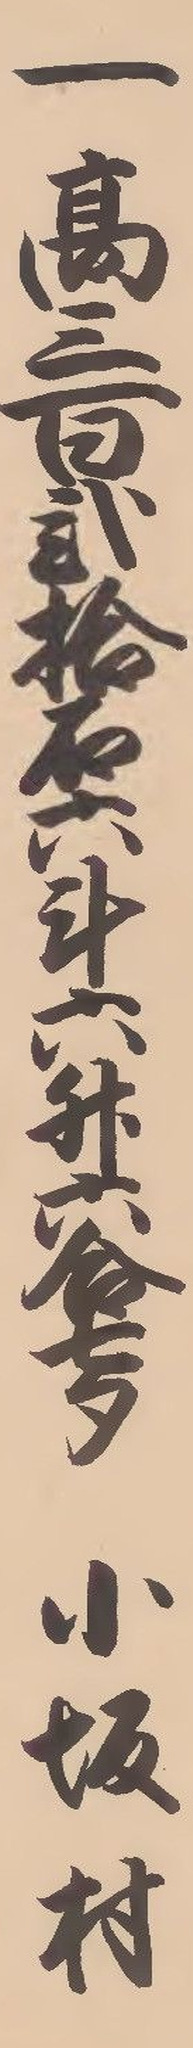一髙三百弐拾石六斗六升六合七夕小坂村
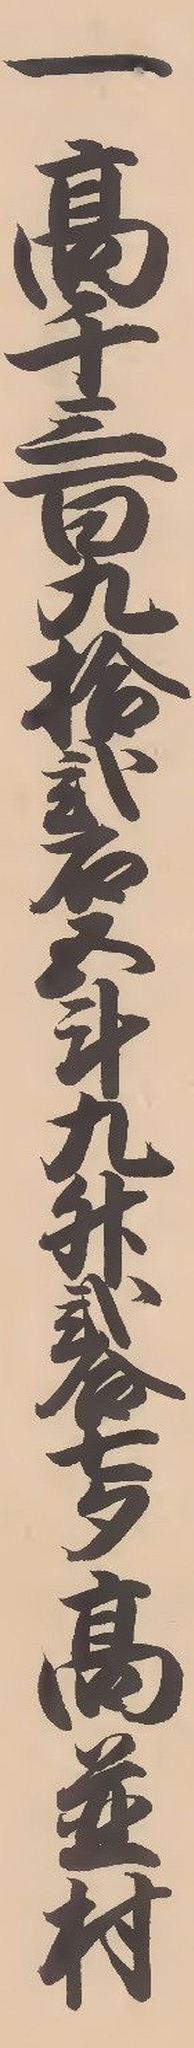一髙千三百九拾弐石五斗九升弐合七夕髙並村
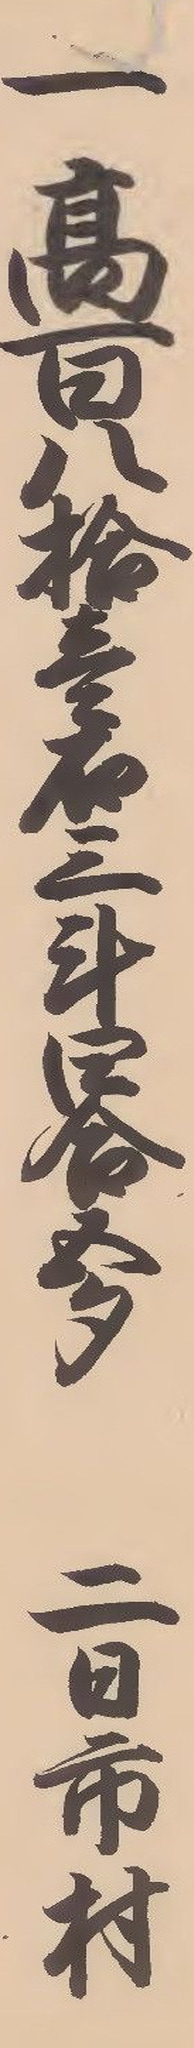一髙百八拾壱石三斗四合五夕二日市村
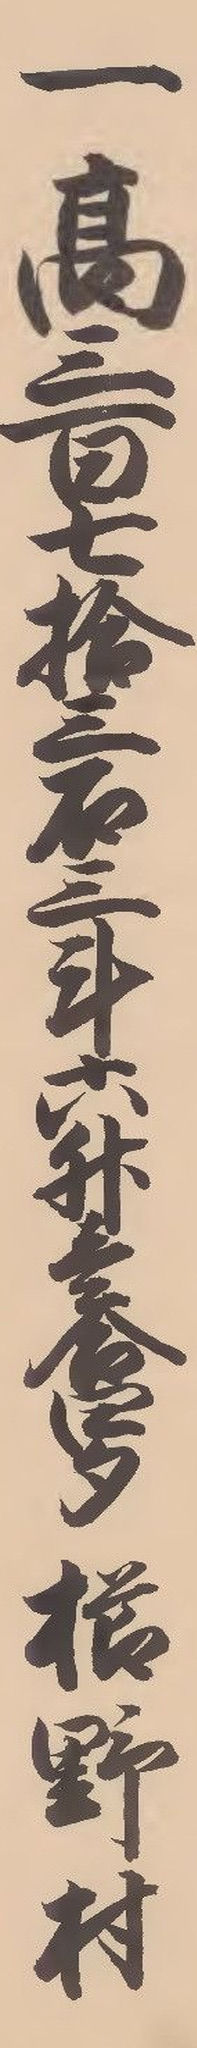一髙三百七拾三石三斗六升壱合四夕櫛野村
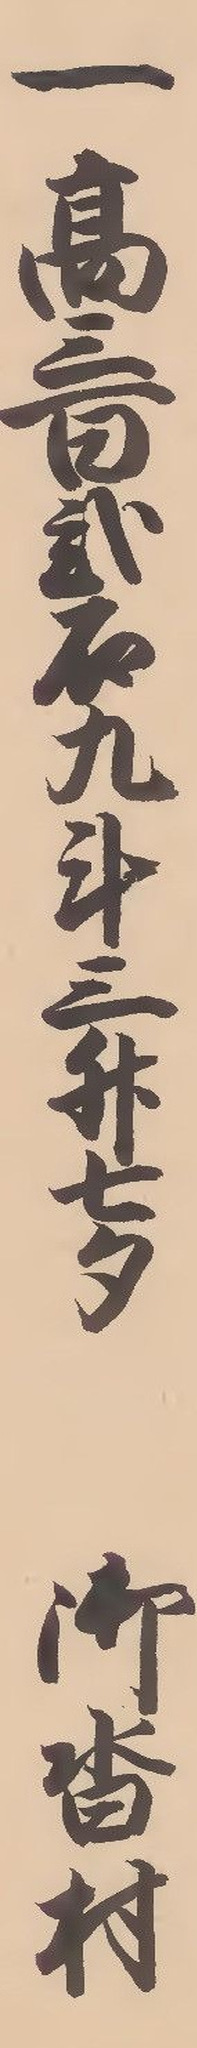一髙三百弐石九斗三升七夕御沓村

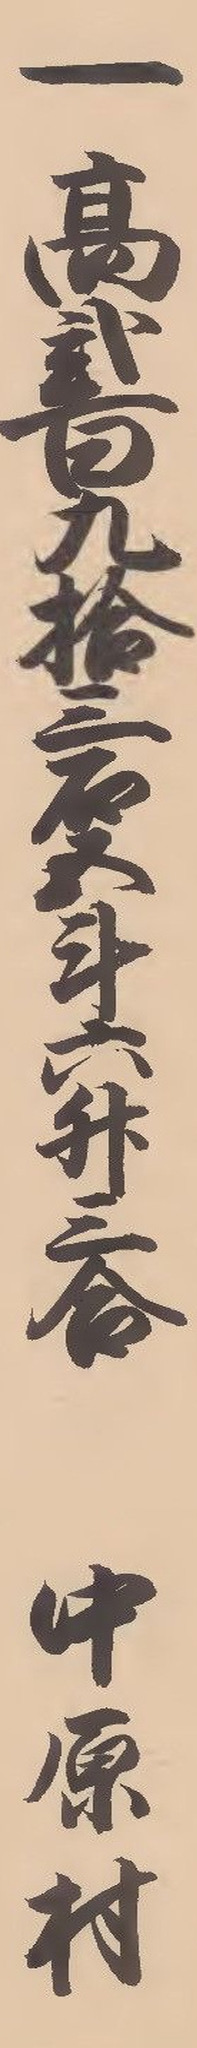一髙弐百九拾三石五斗六升三合中原村
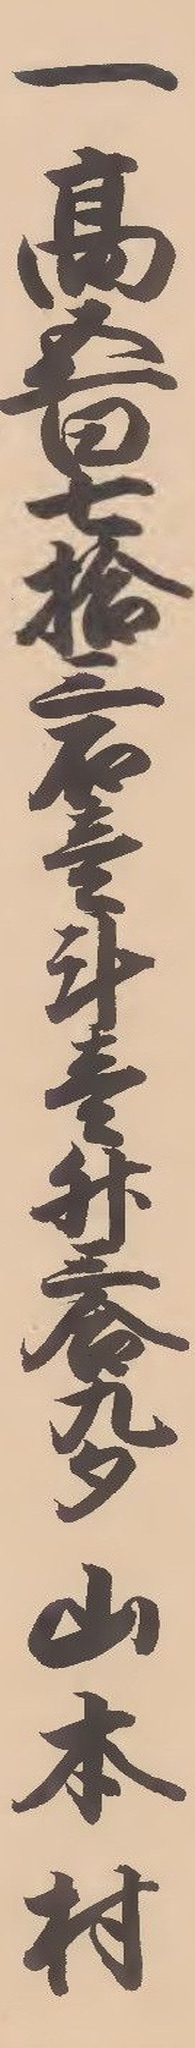一髙五百七拾三石壱斗壱升三合九夕山本村
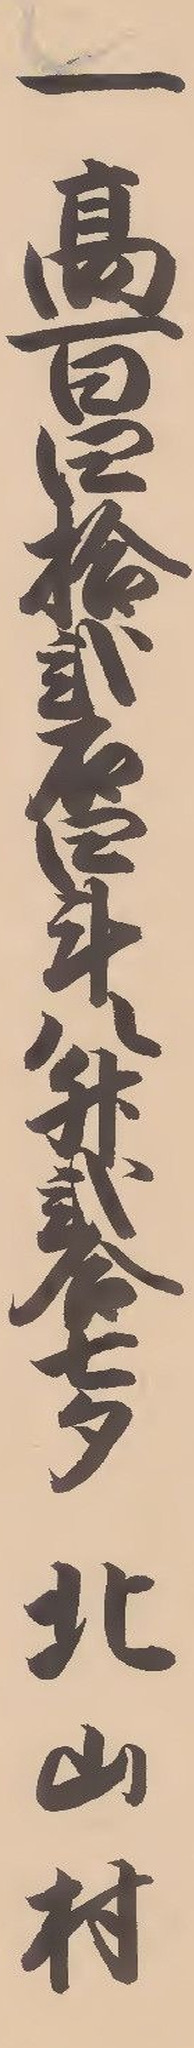一高百四拾弐石四斗八升弐合七夕北山村
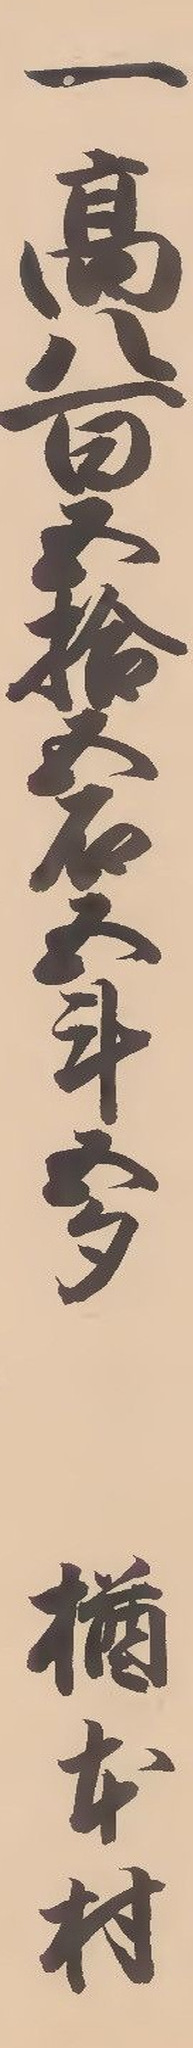一髙八百五拾五石五斗五夕楢本村
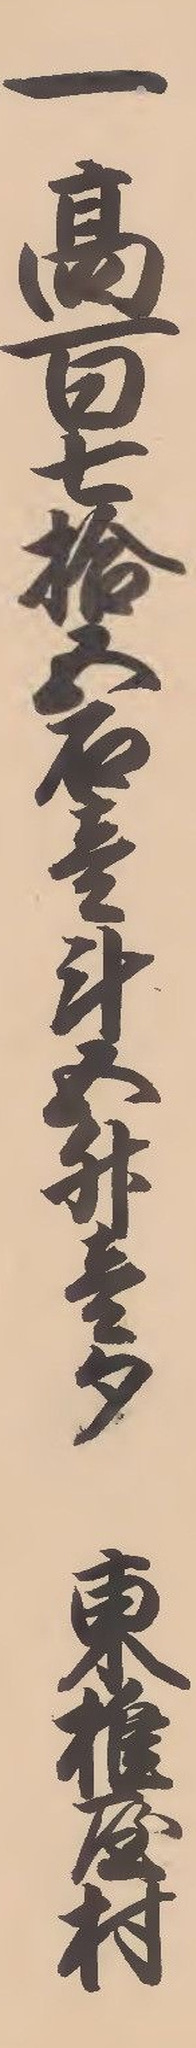一髙百七拾五石壱斗五升壱夕東椎屋村
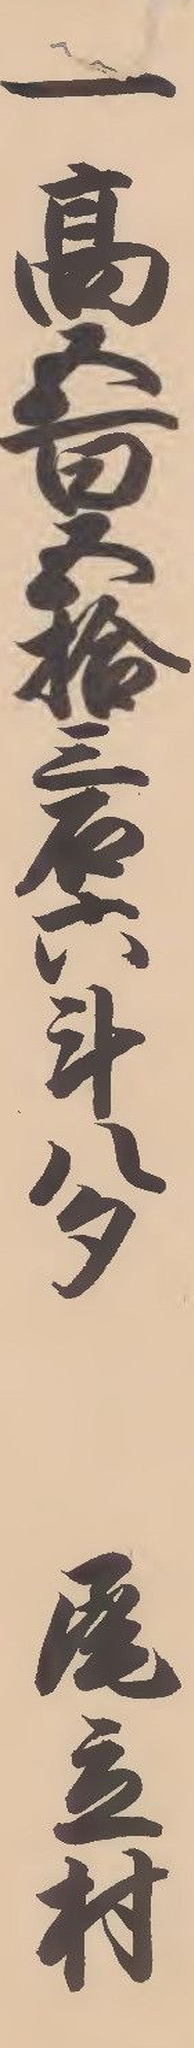一髙五百五拾三石六斗八夕尾立村
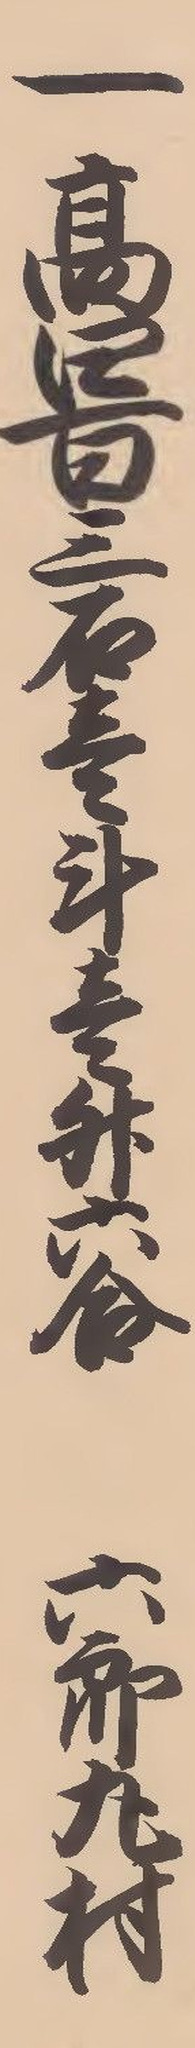一髙四百三石壱斗壱升六合六郎丸村
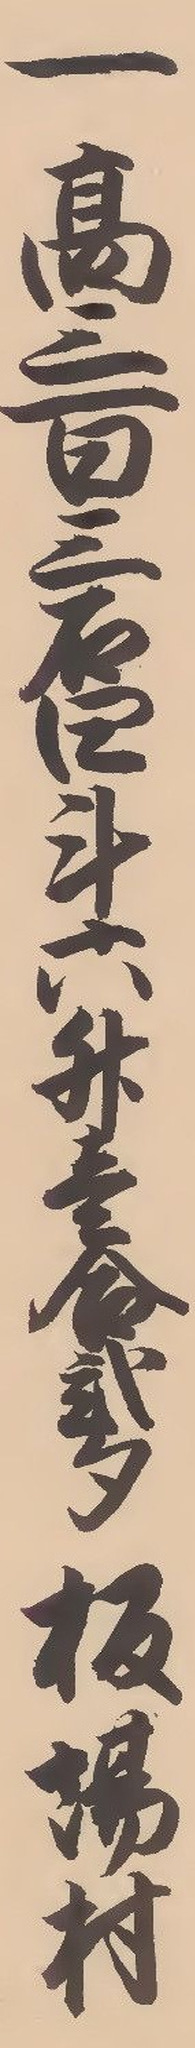一髙三百三石四斗六升壱合弐夕板湯村
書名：豊前国郷帳
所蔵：国立公文書館 National Archives of Japan
